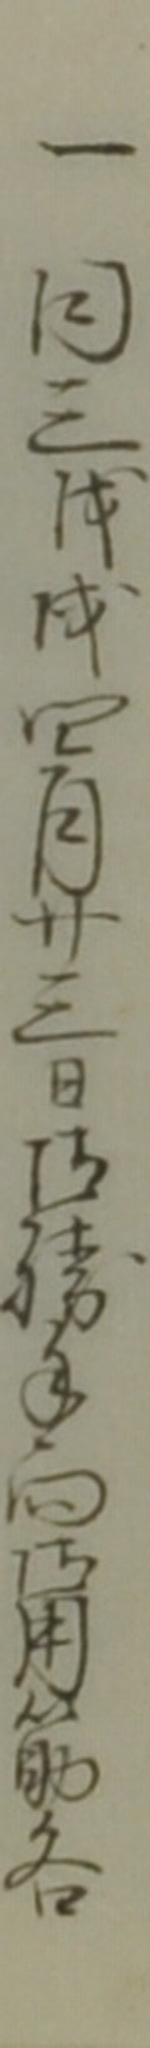一同三戊戌四月廿三日御勝手向御用筋各
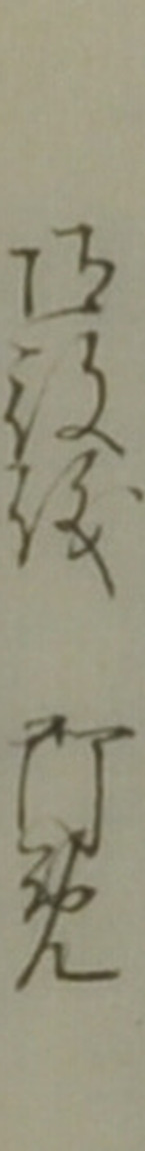御役儀御免
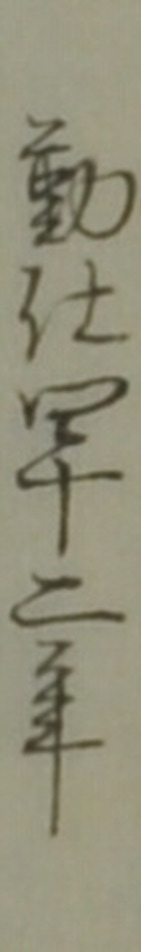勤仕四十二年
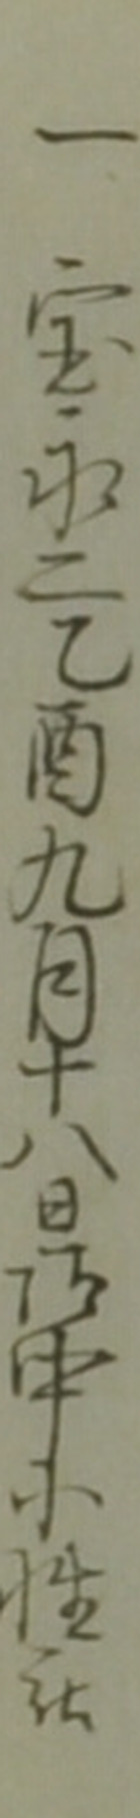一宝永二乙酉九月十八日御中小性被
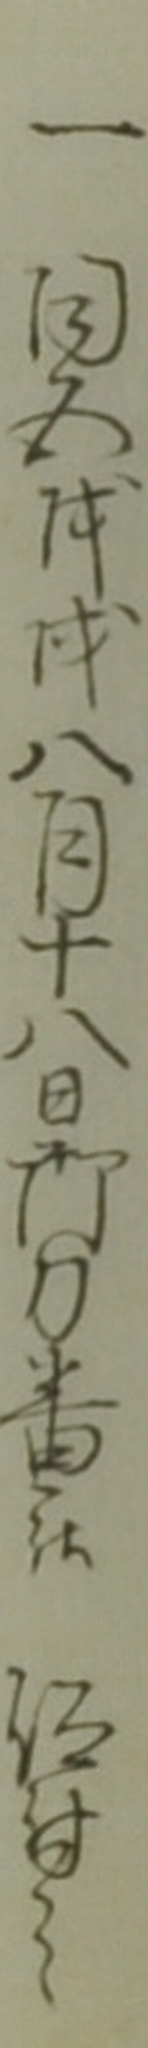一同五戊戌八月十八日御力番被仰付之
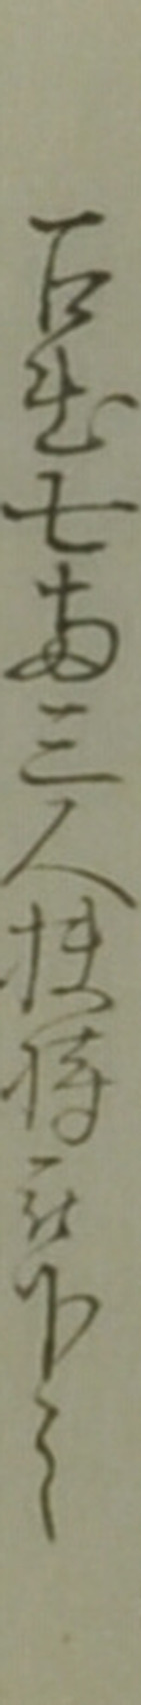召出七両三人扶持被下之
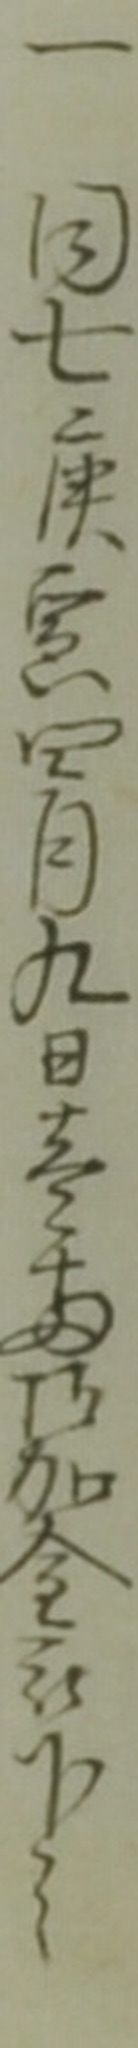一同七庚寅四月九日壱両御加金被下之
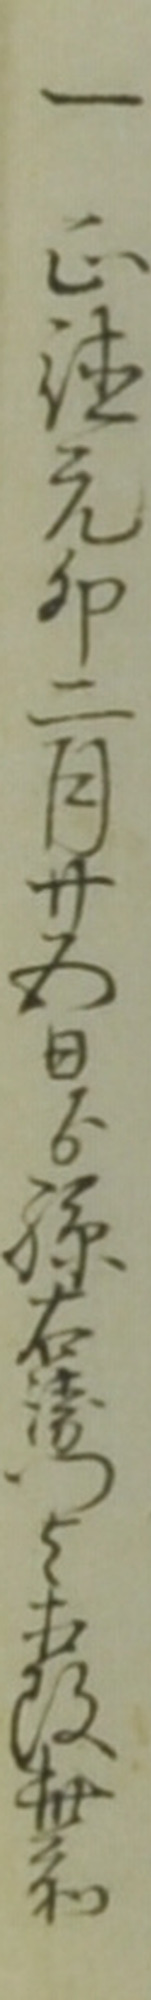一正徳元卯二月ｎ廿五日ゟ孫右衛門与相改此前

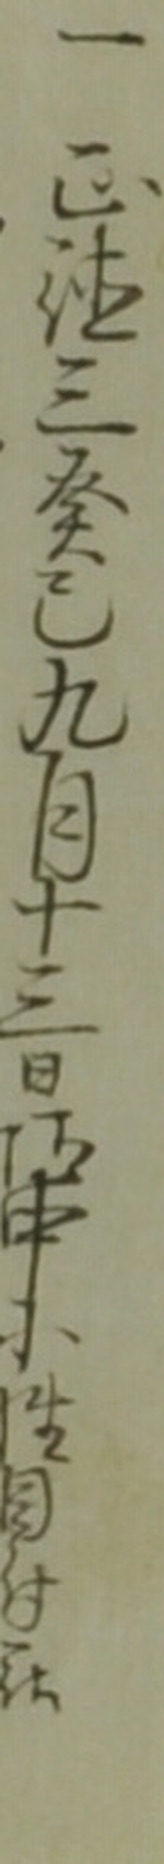一正徳三癸巳九月十三日御中小性目付被
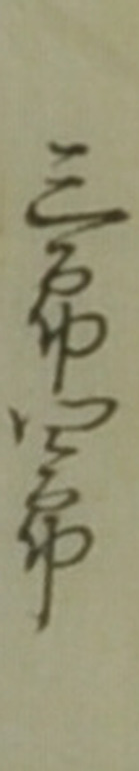三郎四郎
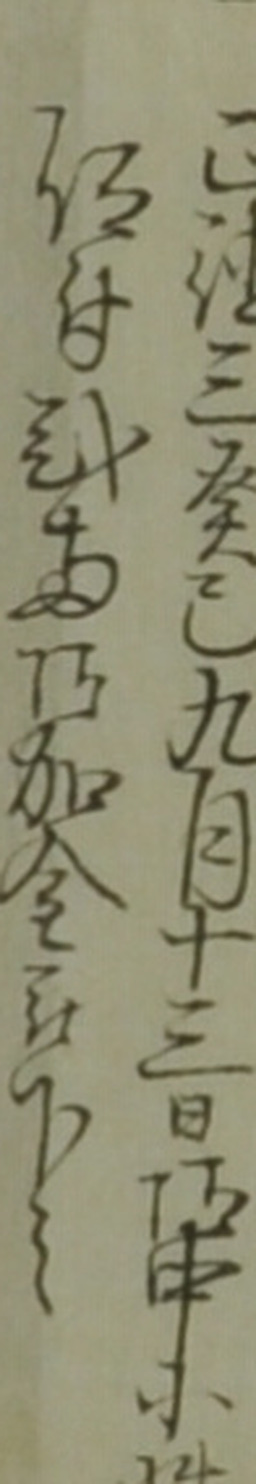仰付弐両御加金被下之
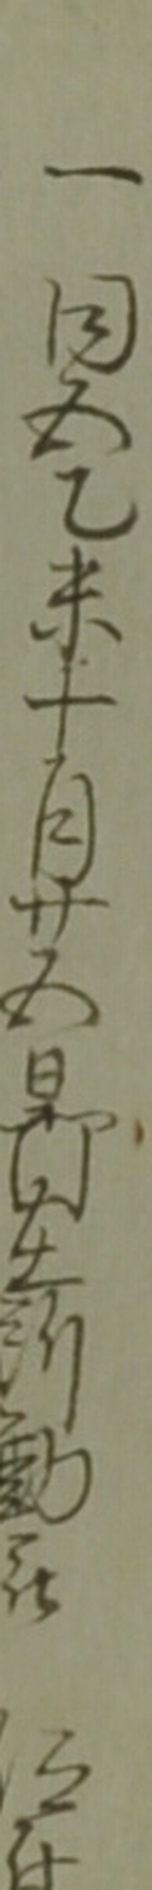一同五乙未十月廿五日御在所勤被仰付
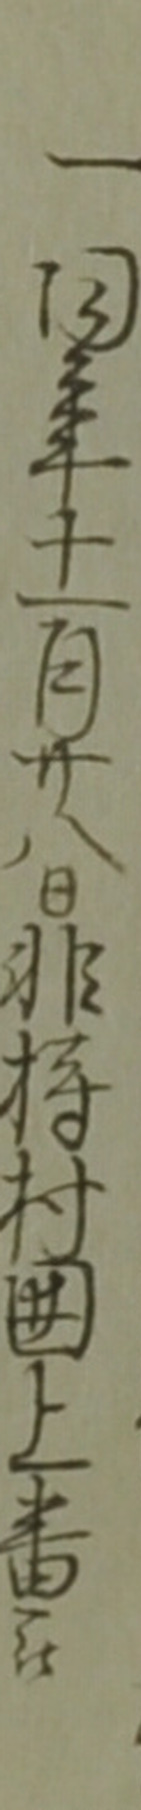一同年十一月廿八日非持村囲上番被
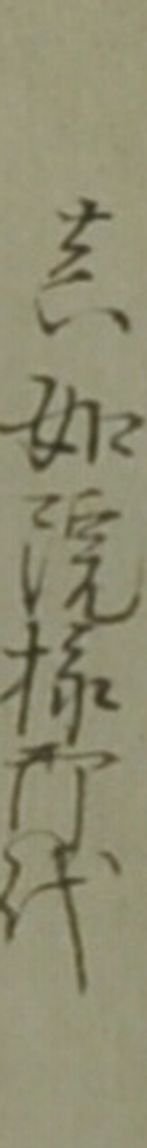真如院様御代
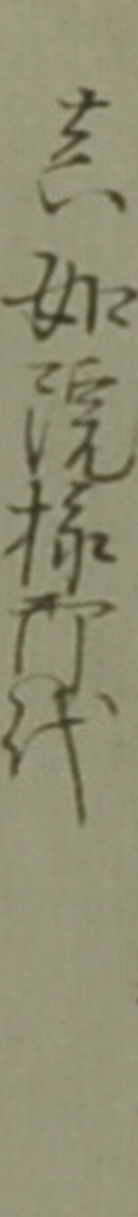真如院様御代
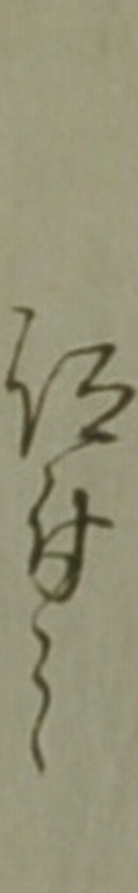仰付之
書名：給人諸士勤仕録（三）
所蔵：伊那市立高遠町図書館・合同会社AMANE
